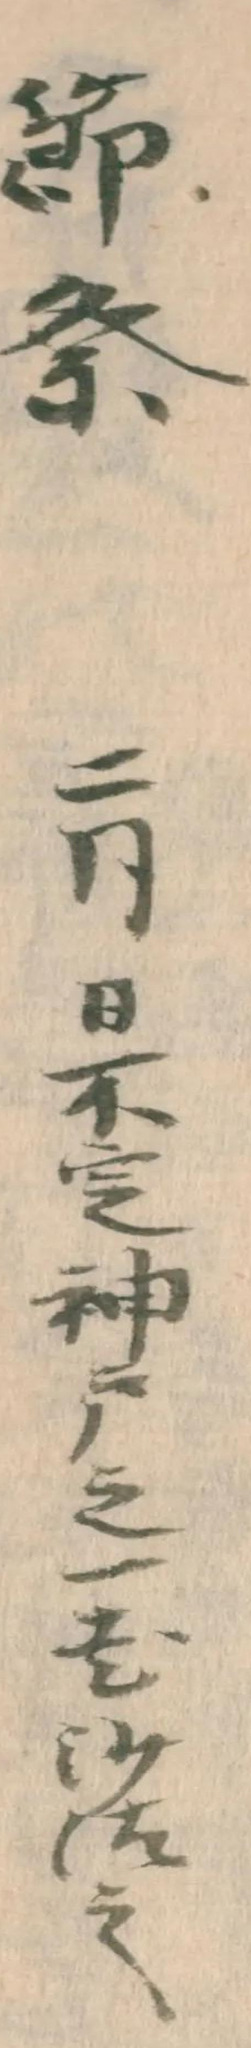節祭二月日不定神戸之一老沙汰之
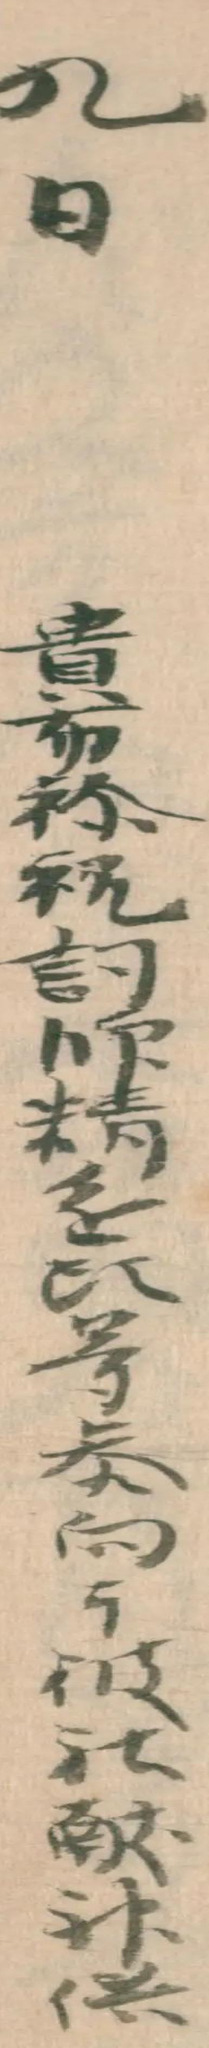九日貴ふね祝詞師精進頭等参向于彼社献神供
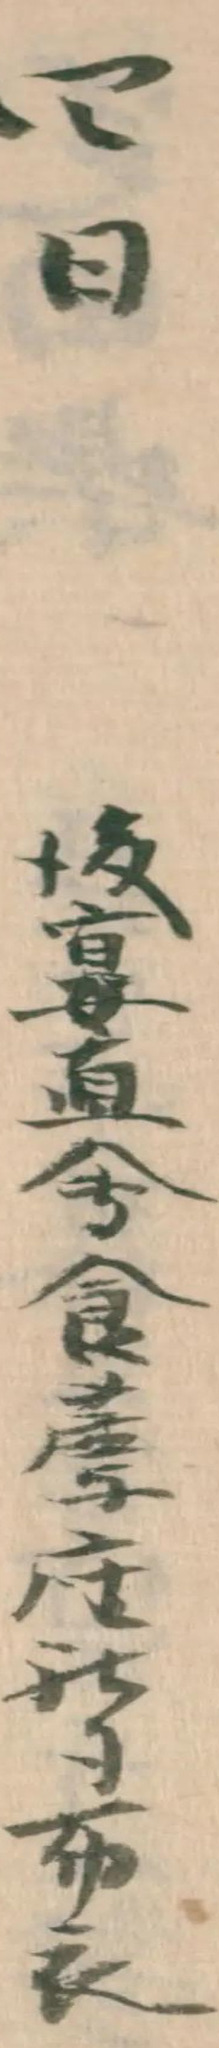四日後宴直会食薦座社司布衣
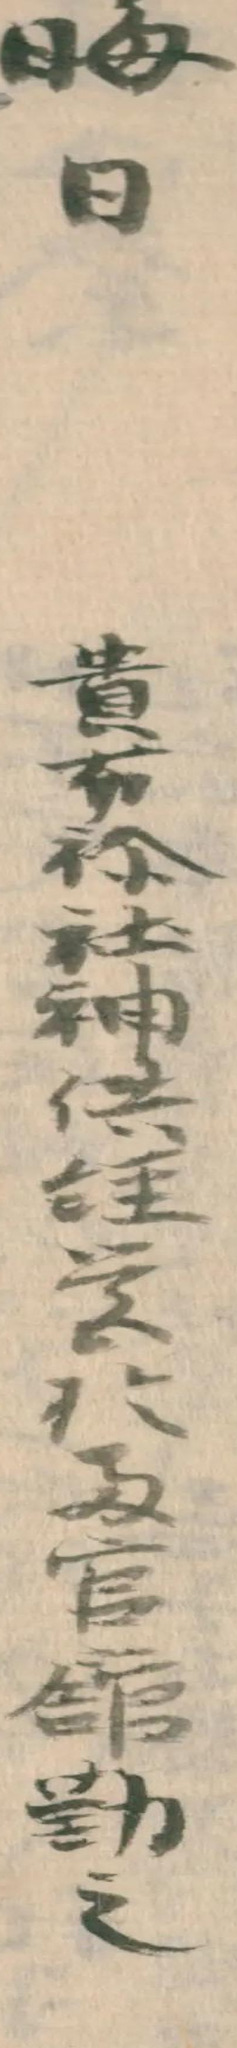晦日貴ふね社神供経営於両官館勤之
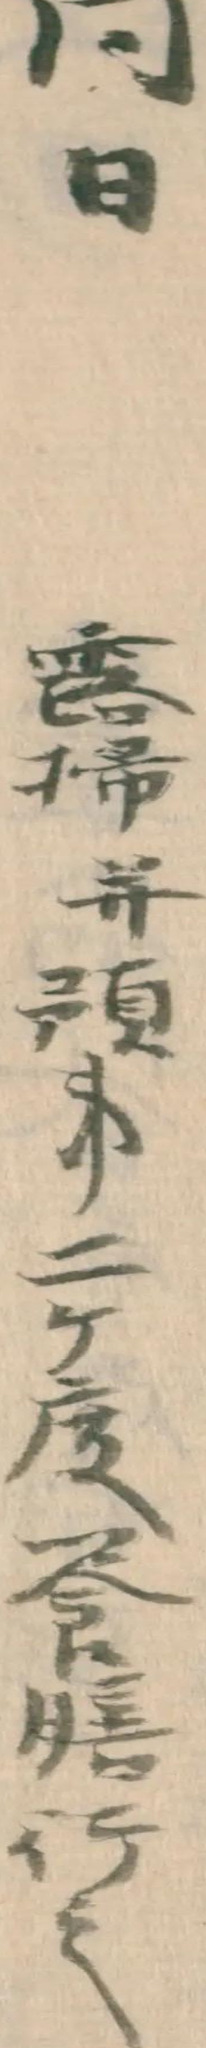同日露掃并預事二ヶ度饗膳行之

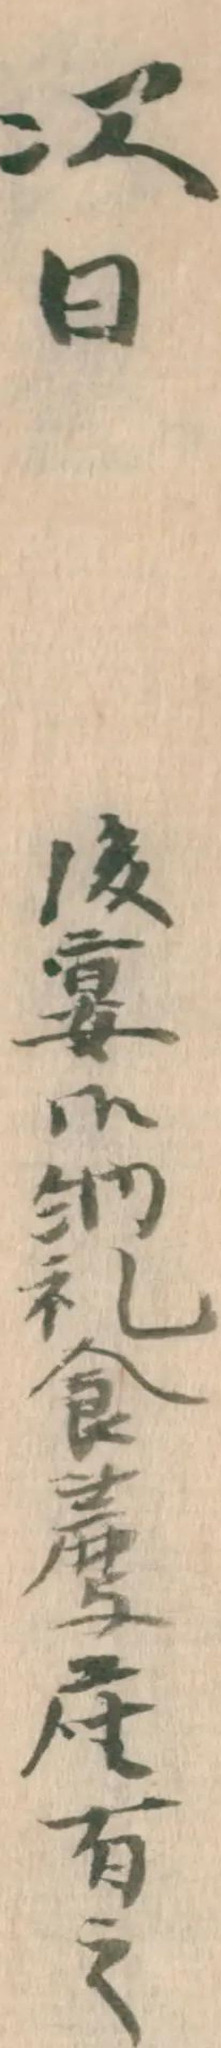次日後宴御納礼食薦座有之
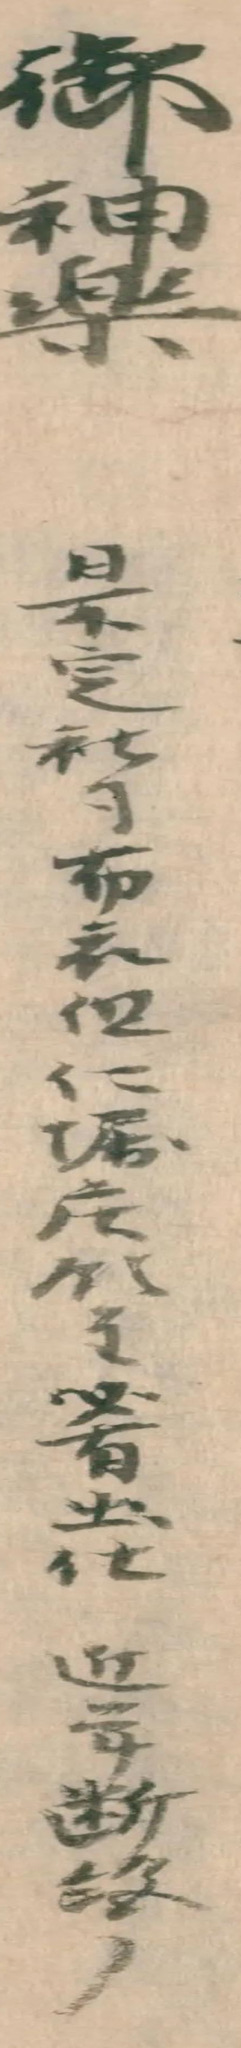御神楽日不定社司布衣但仁堀庄領主必有出仕近年断絶之
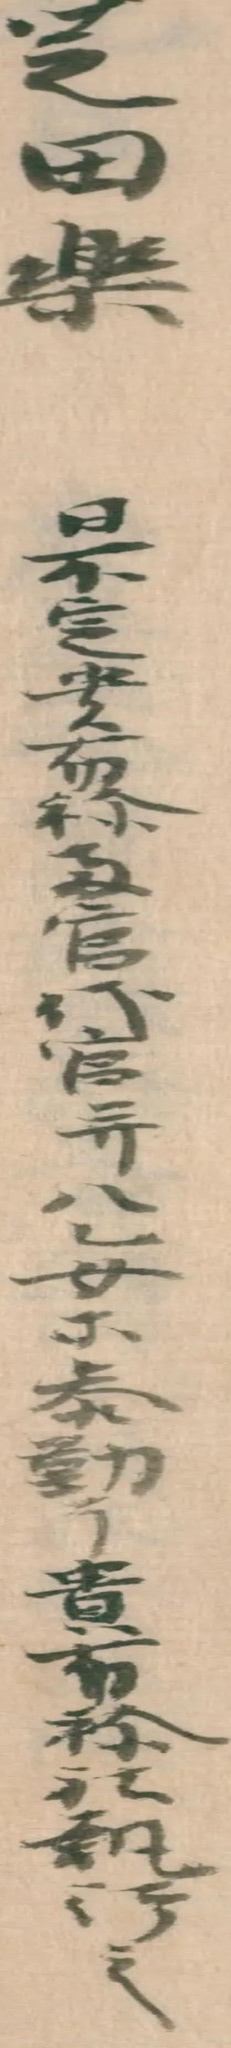芝田楽日不定貴ふね両官代官并八乙女等参勤于貴ふね社執行之
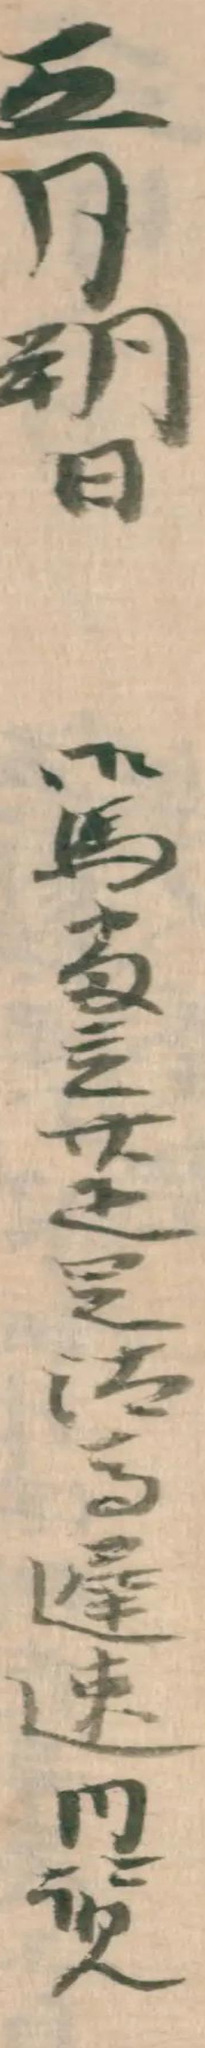五月朔日御馬番立廿疋足汰馬遅速内覧
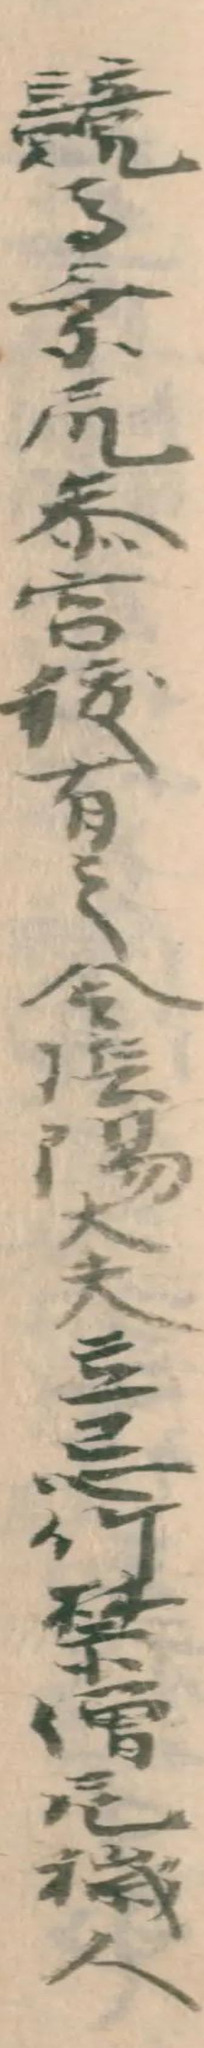三日競馬乗尻参宮祓有之令陰陽大夫立忌竹禁僧尼穢人
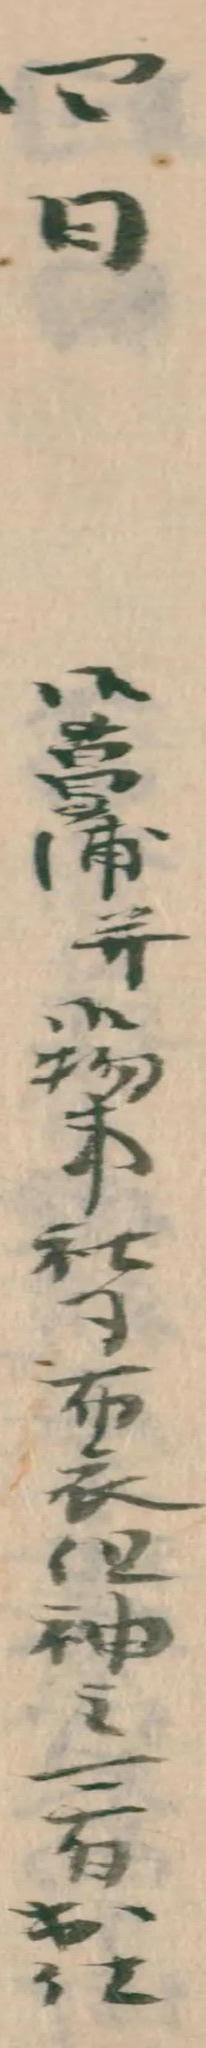四日御菖蒲并御物事社司布衣但神主可有出仕

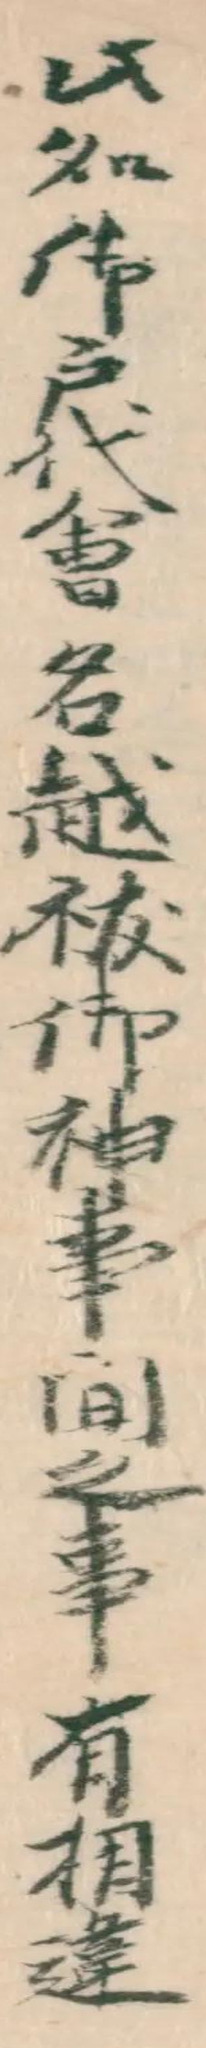此処御戸代会名越祓御神事間之事有相違

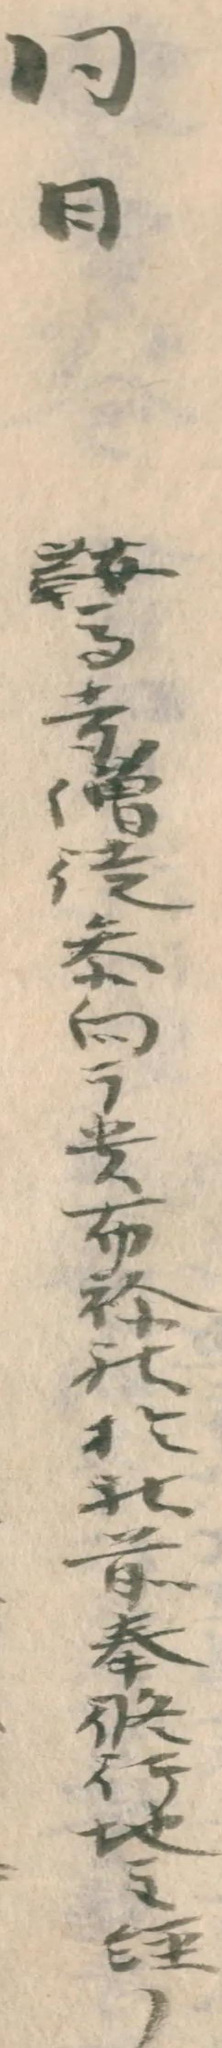同日鞍馬寺僧徒参向于貴ふね社於社前奉修行地主経之
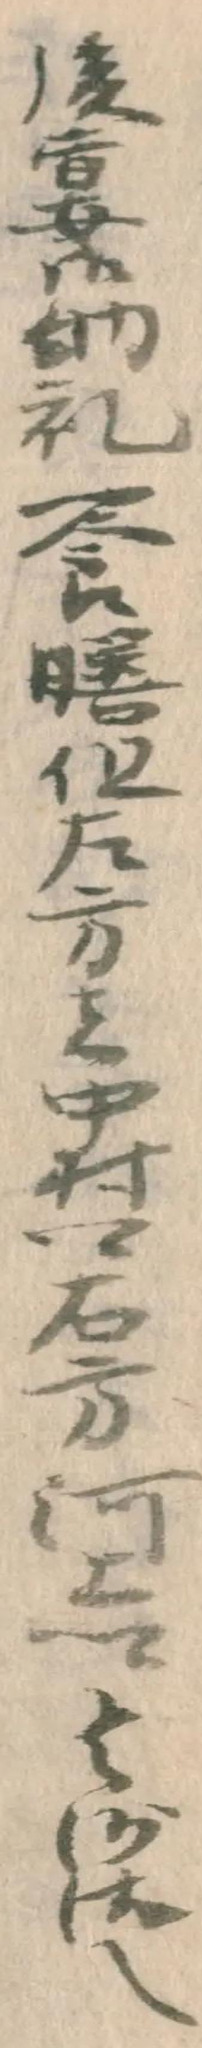十日後宴御納礼饗膳但左方は中村郷右方河上郷令沙汰之
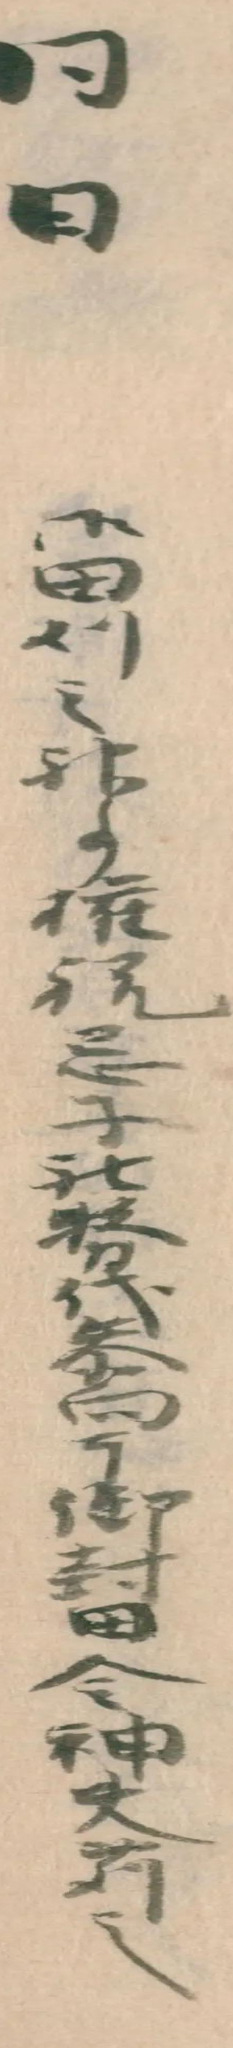同日御田刈之神事権祝忌子社務代参向于御封田令神夫苅之
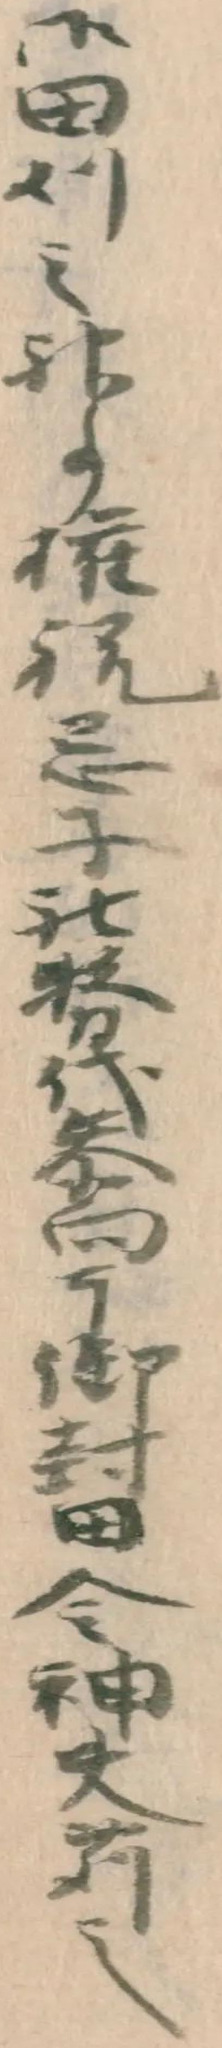同日御田刈之神事権祝忌子社務代参向于御封田令神夫苅之
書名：賀茂社記録. 第1冊
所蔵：国立国会図書館 National Diet Library, JAPAN
